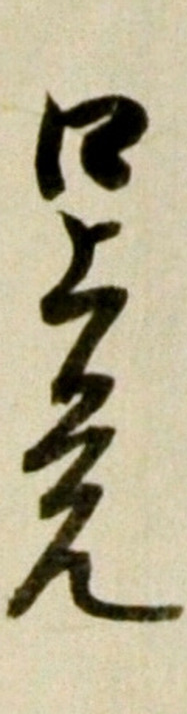口上覚
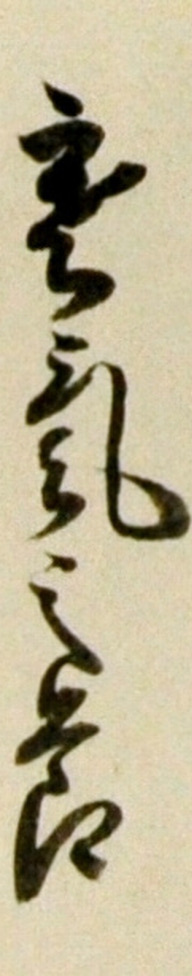寒気之節
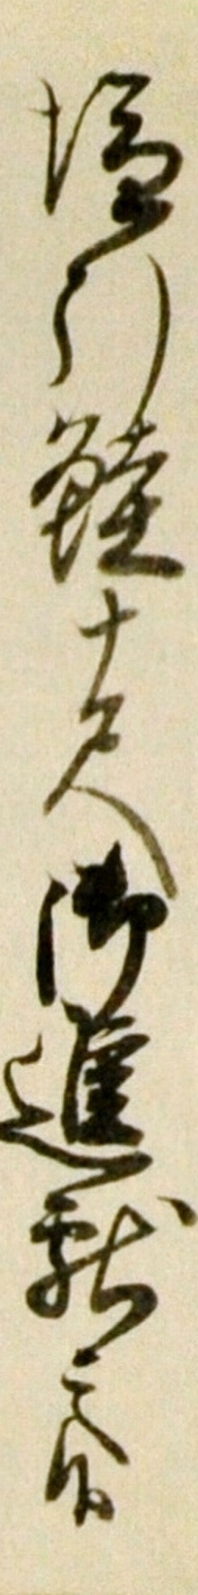塩引鮭十尺御進献之候
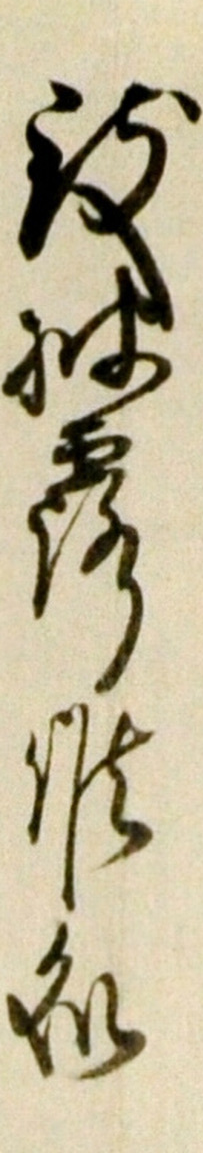致披露候処
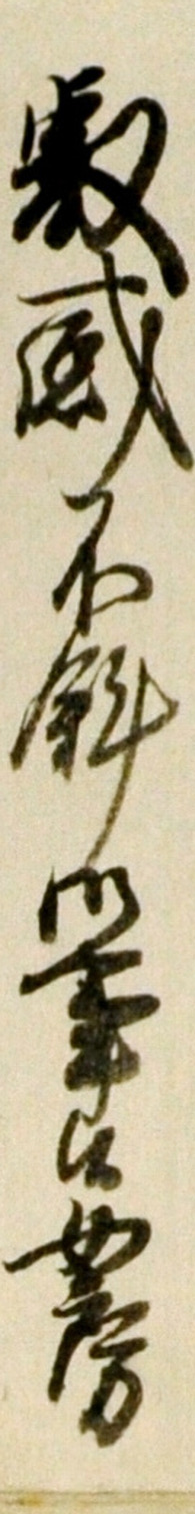叡感不斜御事候女房
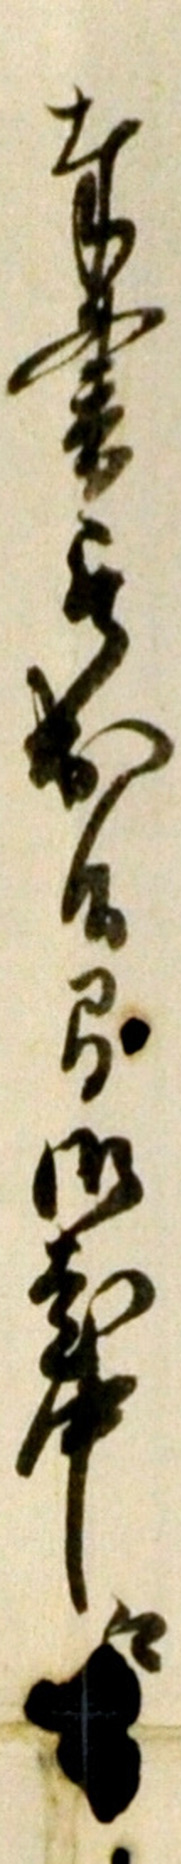奉書被出候間御老中江
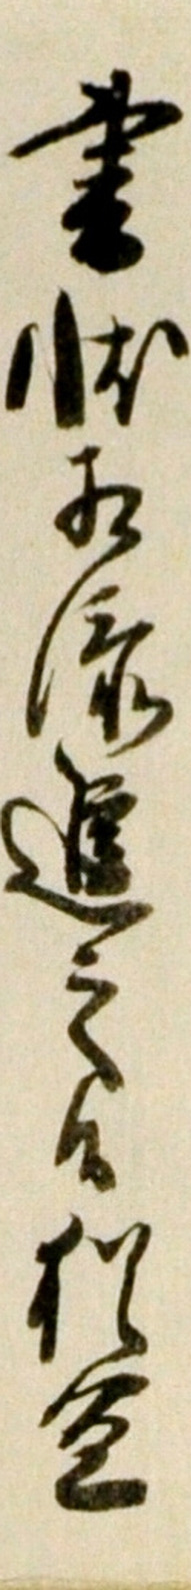書状相添進之候猶宜
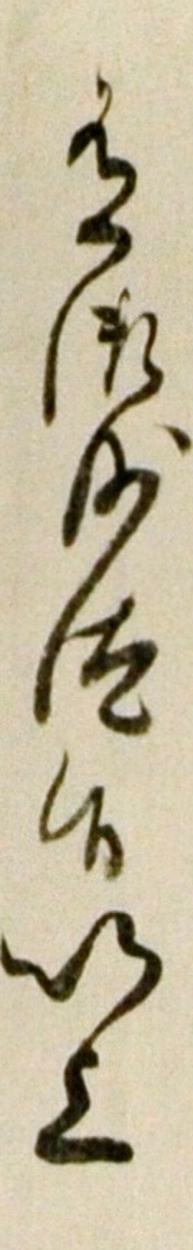有御沙汰候以上
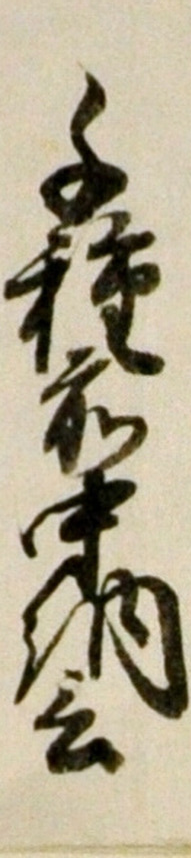千種前中納言
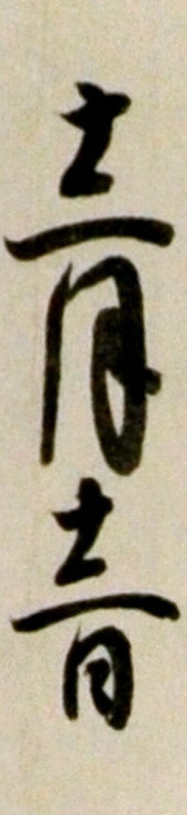十二月十二日
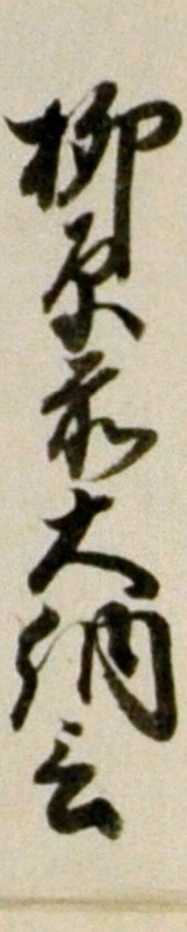柳原前大納言
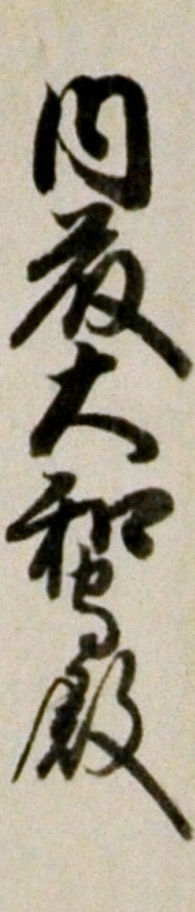内藤大和守殿
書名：口上覚
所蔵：伊那市立高遠町図書館・合同会社AMANE
